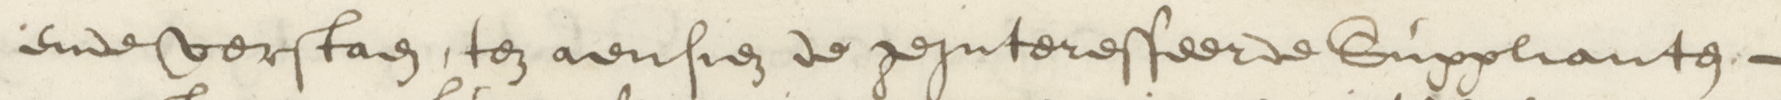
ende verstaen, ten aensien de geinteresseerde Supplianten -
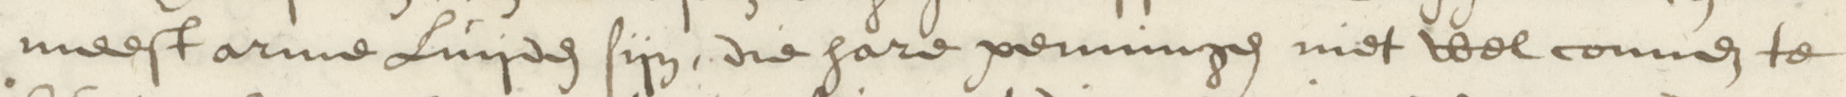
meest arme Luijden sijn, die hare penningen niet wel connen te
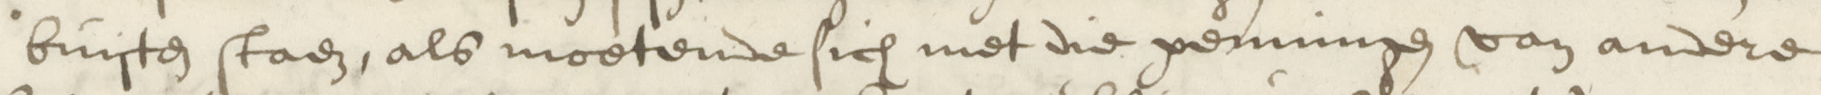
buijten staen, als moetende sich met die penningen van andere
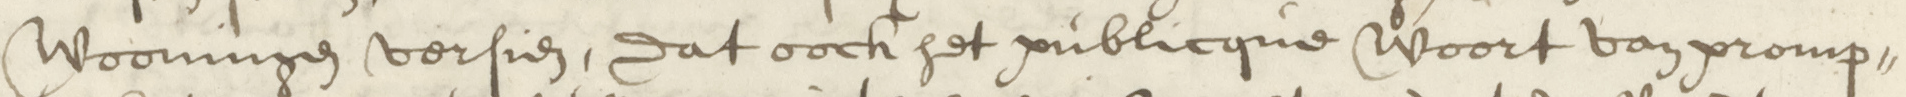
Wooningen versien. Dat oock het publicque Woort van promp„
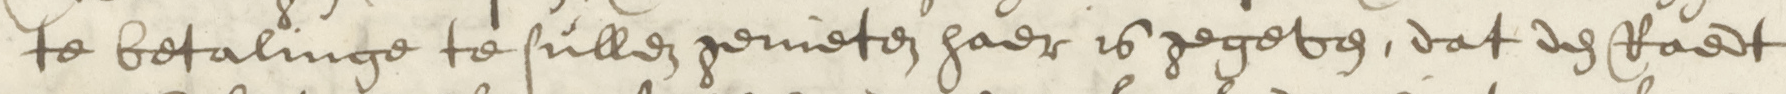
te betalinge te sullen genieten haer is gegeven, dat den Raedt
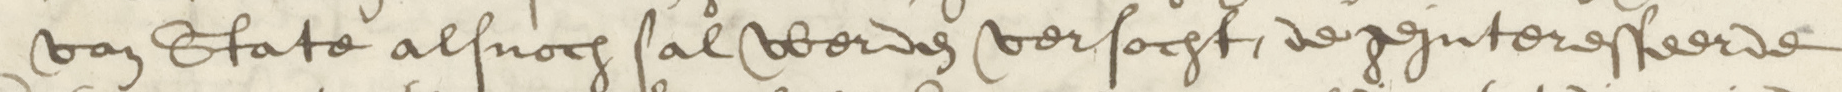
van State alsnoch sal werden versocht, de geinteresseerde
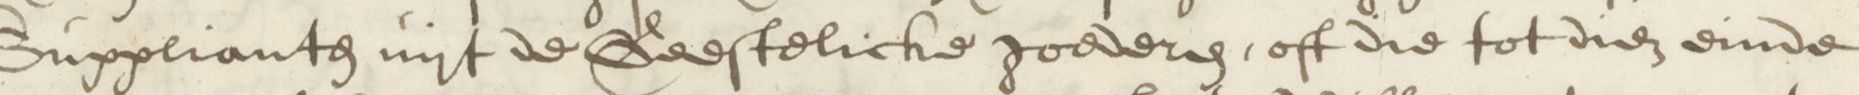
Supplianten uijt de Geestelicke goederen, off die tot dien einde
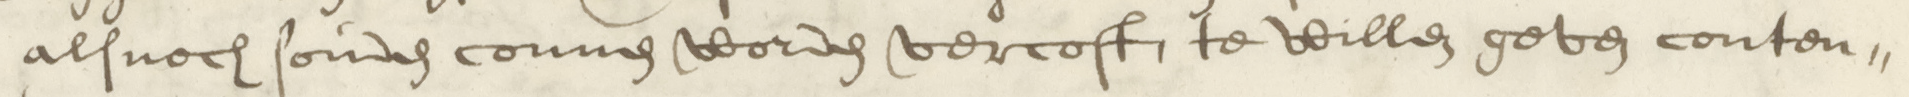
alsnoch souden connen worden vercoft, te willen geven conten„
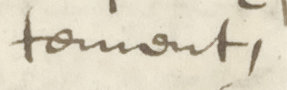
tement.
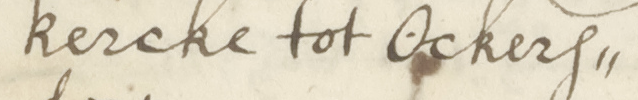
kercke tot Ockers„
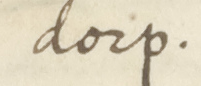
dorp.
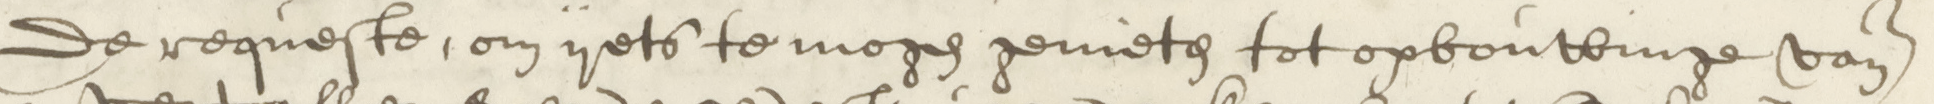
De requeste, om ijets te mogen genieten tot opbouwinge van
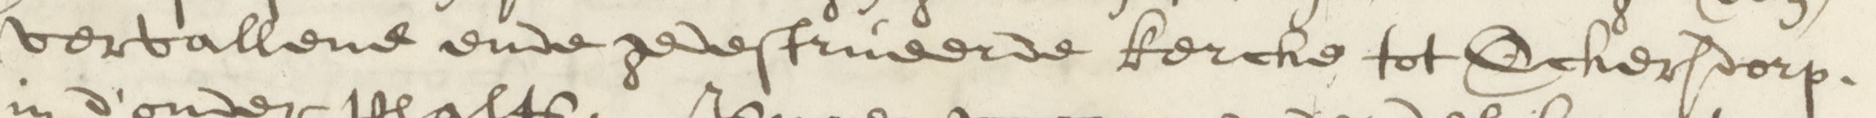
vervallene ende gedestrueerde Kercke tot Ockersdorp,
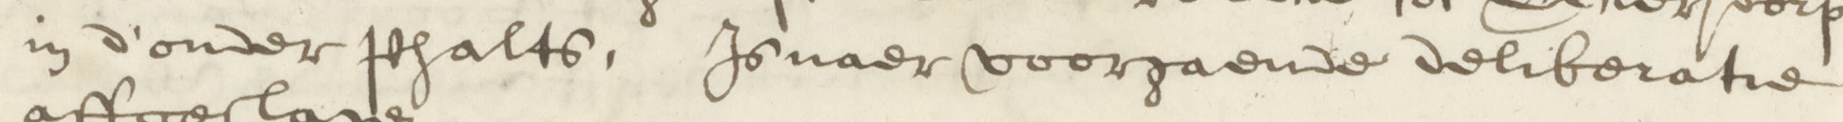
in d'onder Phalts, Is naer voorgaende deliberatie
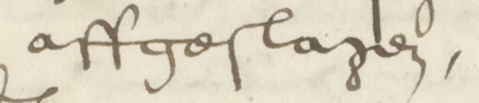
affgeslagen.
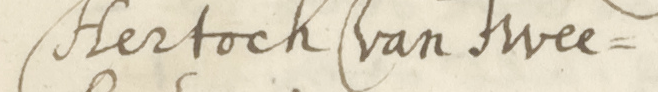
Hertoch van Twee=
